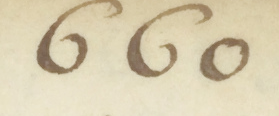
660
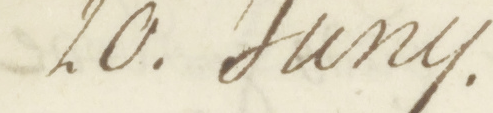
20. Juny
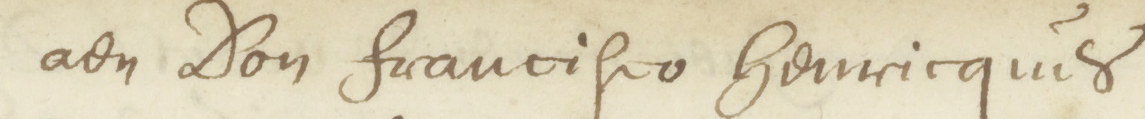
aen Don francisco henricques
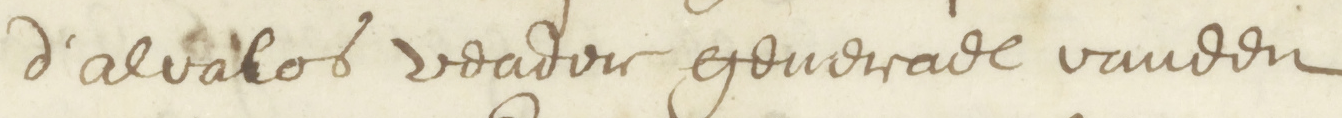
d'alvalos veador generael vanden
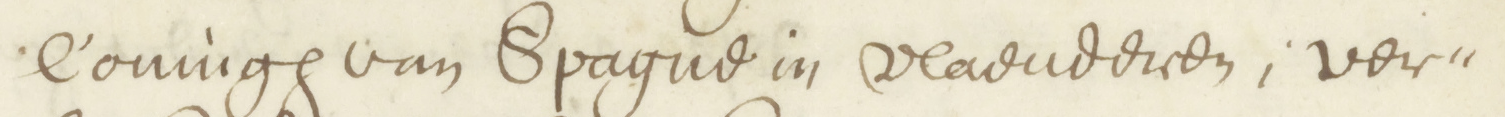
Coningh van Spagne in Vlaenderen; ver,,
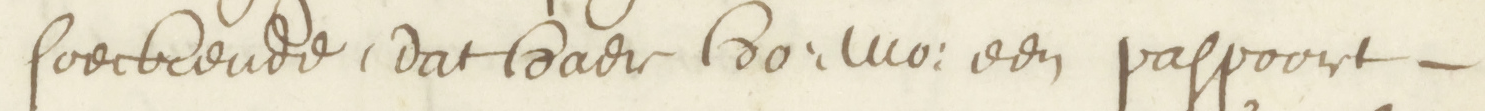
soeckende, dat haer ho:mo: een paspoort -
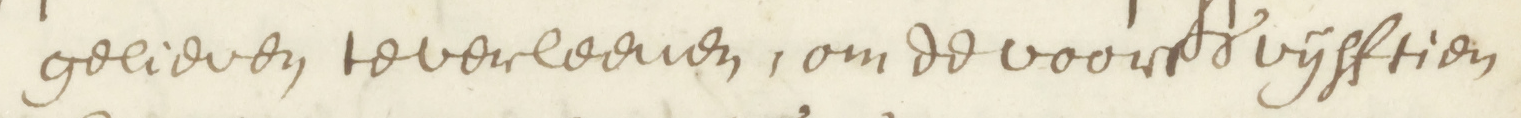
gelieven te verleenen, om de voorss vijfftien
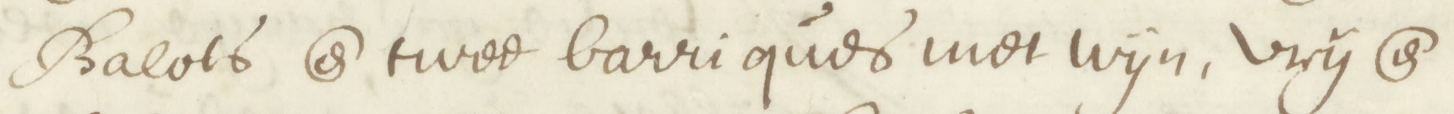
Balots & twee barriques met wijn, vrij &
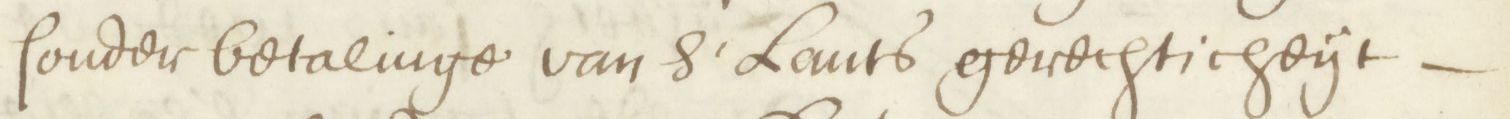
sonder betalinge van s'Lants gerechticheijt -
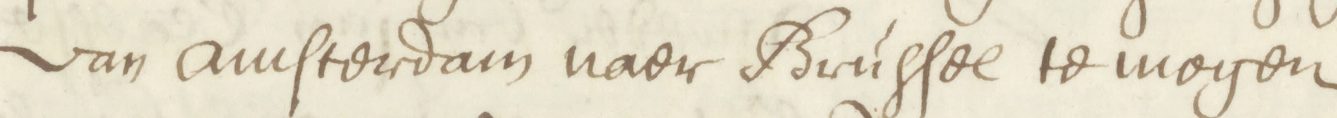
van amsterdam naer Brussel te mogen
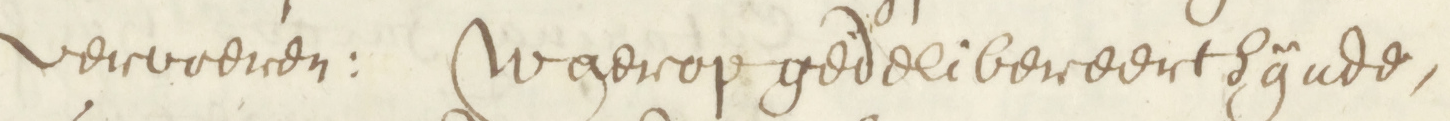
vervoeren: Waerop gedelibereert sijnde,
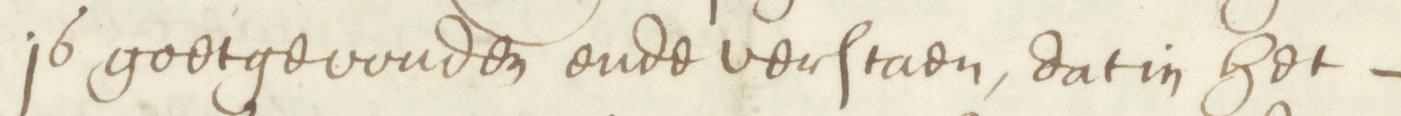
Is goetgevonden ende verstaen, dat in het -
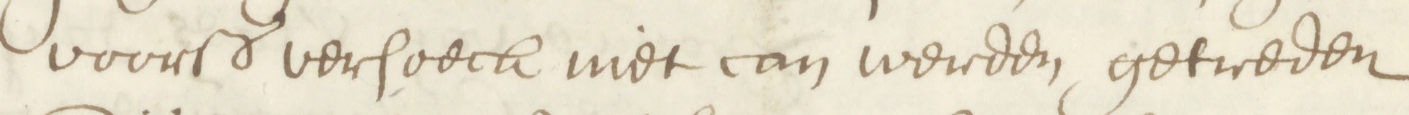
voorss versoeck niet can werden getreden
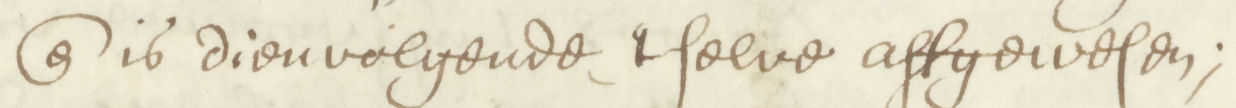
& is dienvolgende 'tselve affgewesen;
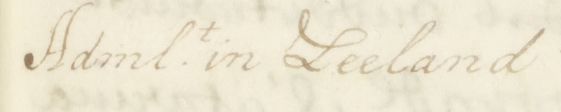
Admlt. in Zeeland
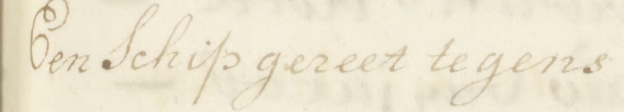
Een Schip gereet tegens
